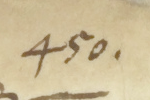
450.
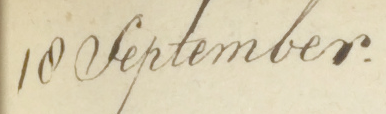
18 September.
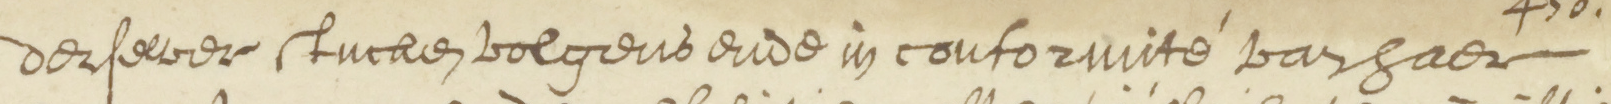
derselver stucken volgens ende in conformité van haer
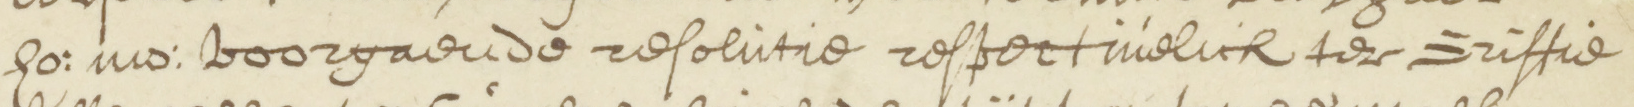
ho:mo: voorgaende resolutie respectiuelick ter Griffie
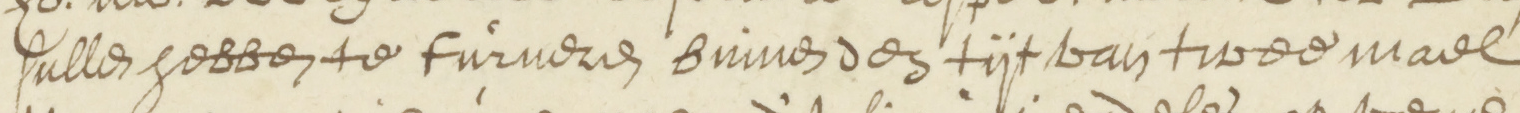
sullen hebben te furneren binnen den tijt van twee mael
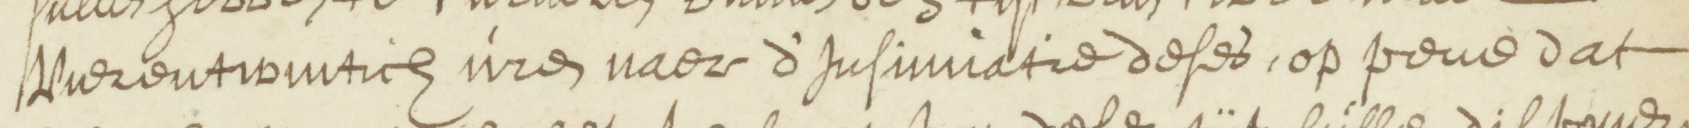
Vierentwintich uren naer d'Insinuatie deses, op pene dat
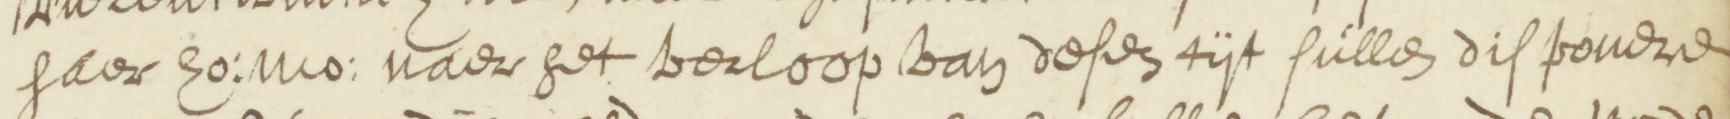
haer ho:Mo: naer het verloop van desen tijt sullen disponeren
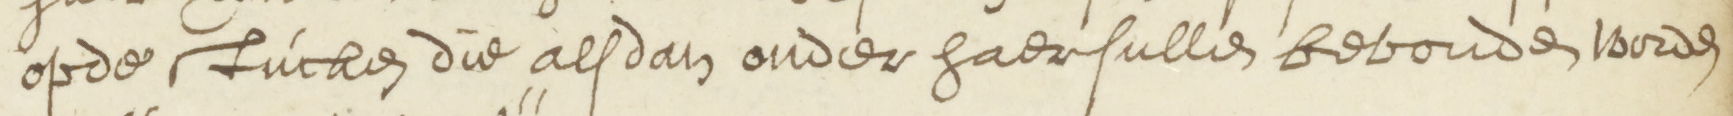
opde stucken die alsdan onder haer sullen bevonden worden
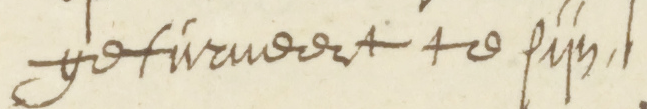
gefurneert te sijn.
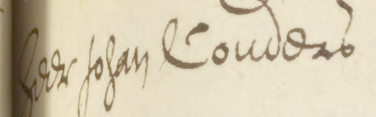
heer Johan Conders
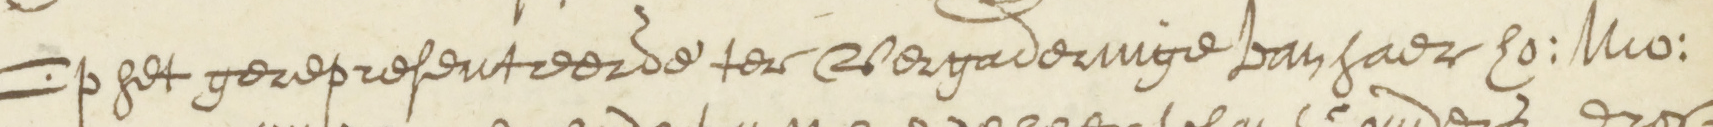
Op het gerepresenteerde ter Vergaderinge van haer ho:Mo:
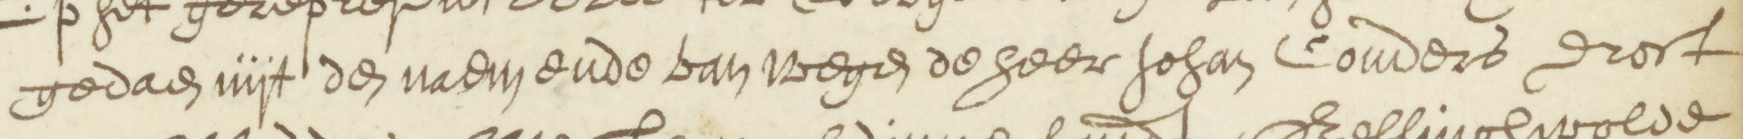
gedaen uijt den naem ende van wegen de heer Johan Conders drost
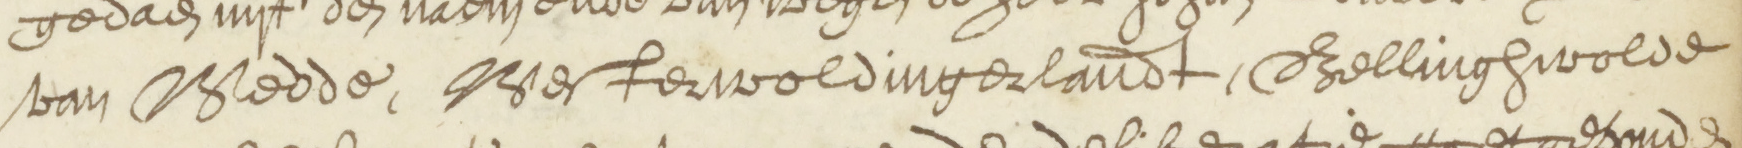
van Wedde, Westerwoldingerlandt, Bellinghwolde
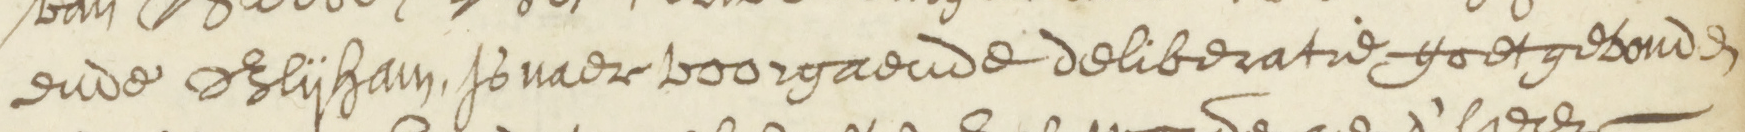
ende Blijham, Is naer voorgaende deliberatie goetgevonden
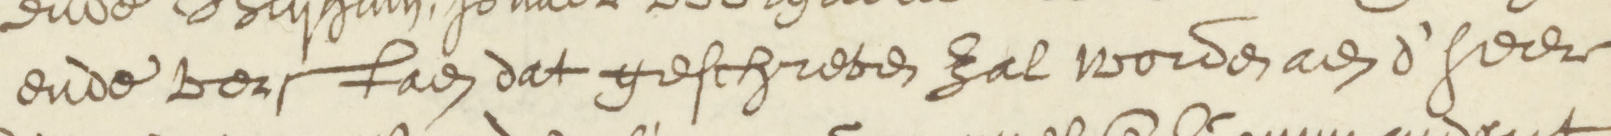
ende verstaen dat geschreven zal worden aen d'heer
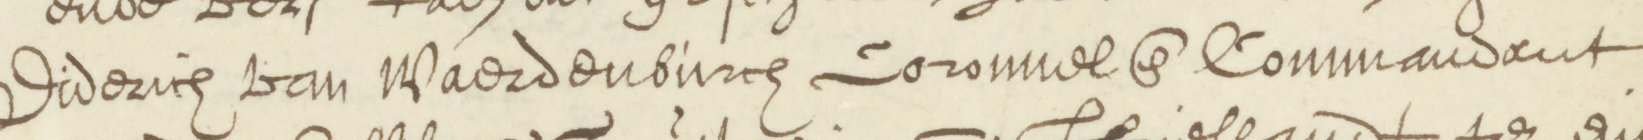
Diderich van Waerdenburch Coronnel & Commandant
